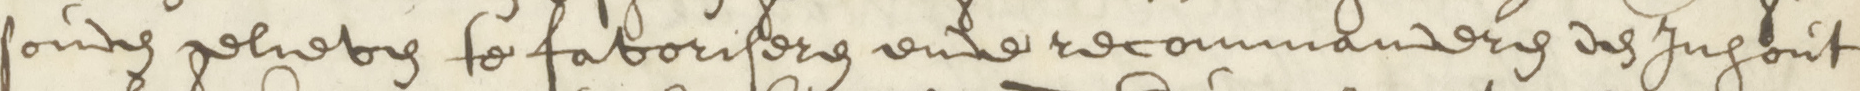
souden gelieven te favoriseren ende recommanderen den Inhout
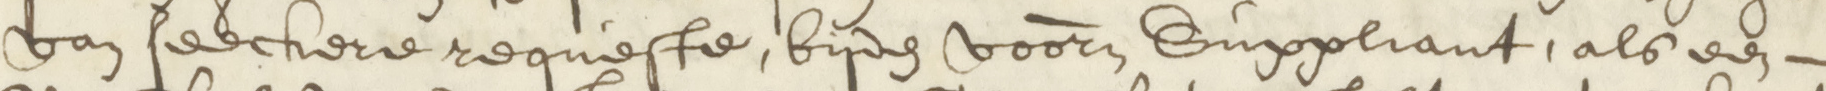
van seeckere requeste, bijden voorn Suppliant, als een —
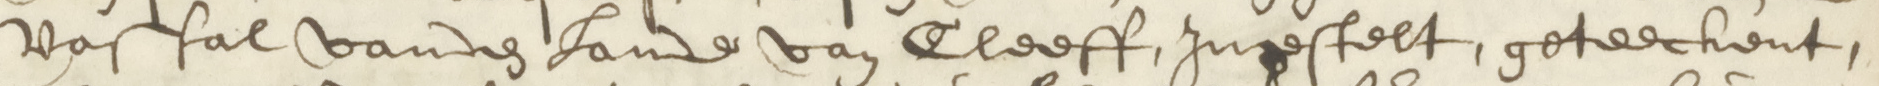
Vassal vanden Lande van Cleeff, Ingestelt, geteeckent,
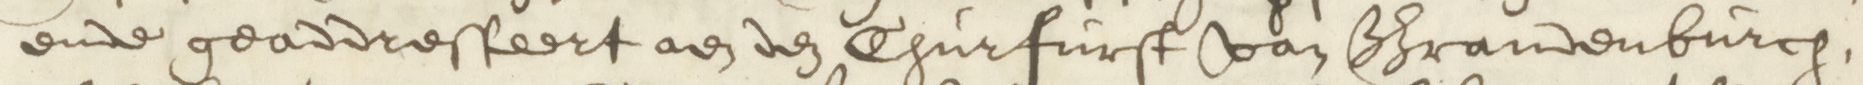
ende geaddresseert aen den Churfurst van Brandenburch,
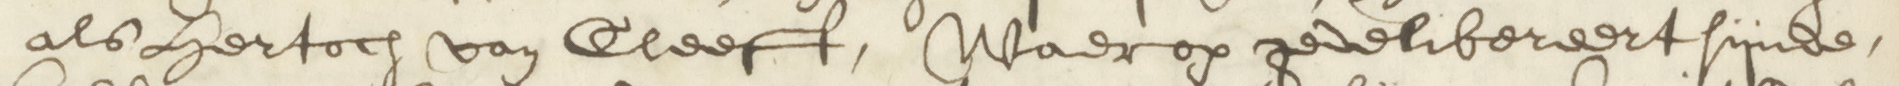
als hertoch van Cleeff. Waerop gedelibereert sijnde,
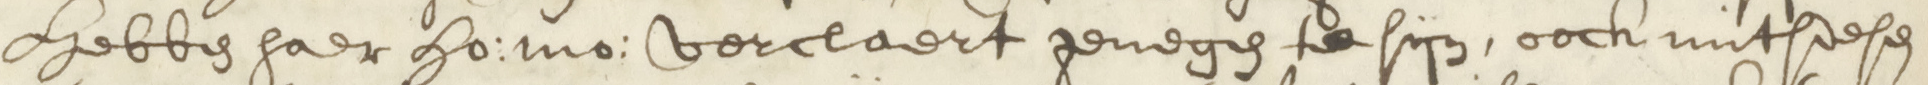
hebben haer Ho:Mo: verclaert genegen te sijn, oock mitsdesen
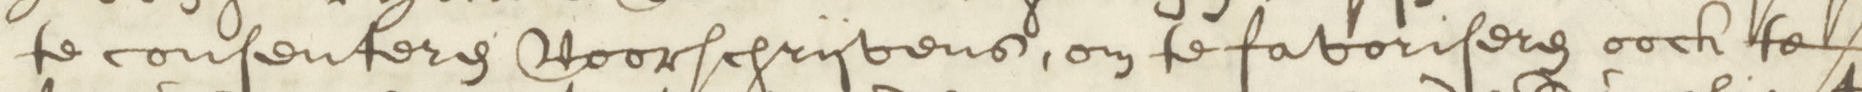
te consenteren Voorschrijvens, om te favoriseren oock te
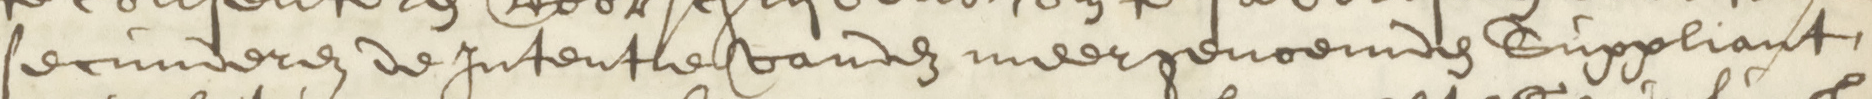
secunderen de Intentie vanden meergenoemden Suppliant,
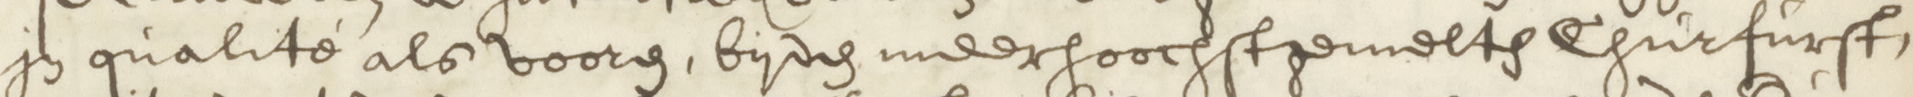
in qualité als vooren, bijden meerhoochstgemelten Churfurst,
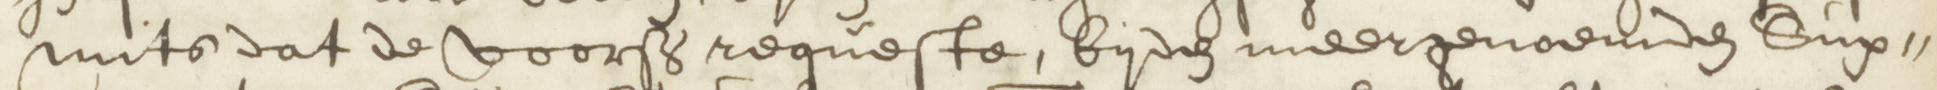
mits dat de voors requeste, bijden meergenoemden Sup„
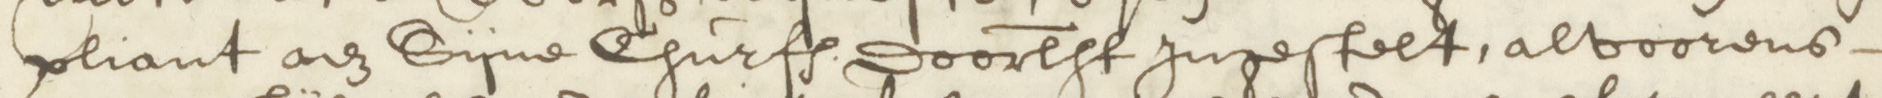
pliant aen Sijne Churfl. Doorlht Ingestelt, alvoorens —
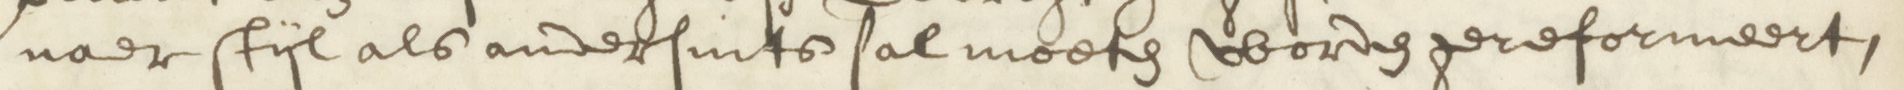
naer stijl als andersints sal moeten worden gereformeert.
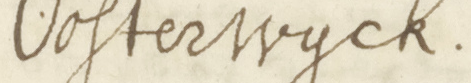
Oosterwijck.
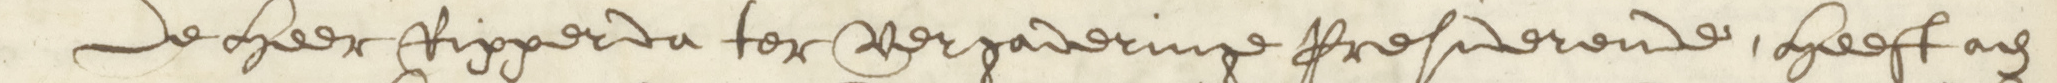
De heer Ripperda ter Vergaderinge presiderende, heeft aen
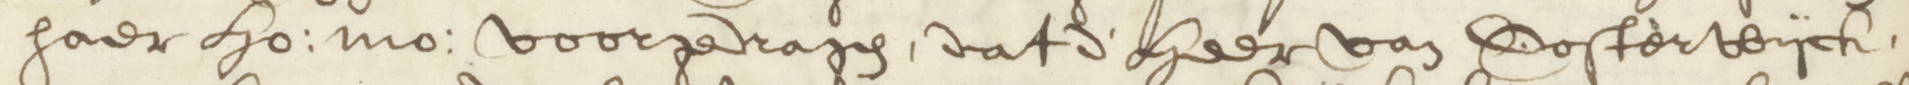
haer Ho:Mo: voorgedragen, dat d'heer van Oosterwijck,
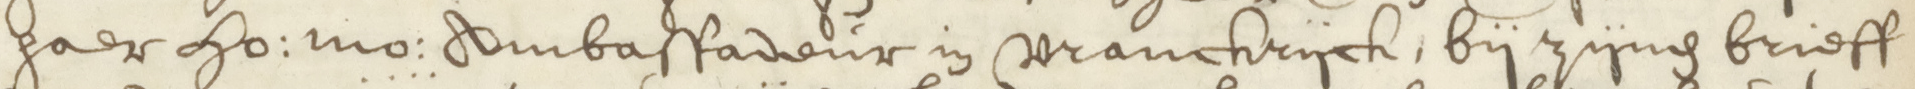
haer Ho:Mo: Ambassadeur in Vranckrijck, bij zijnen brieff
